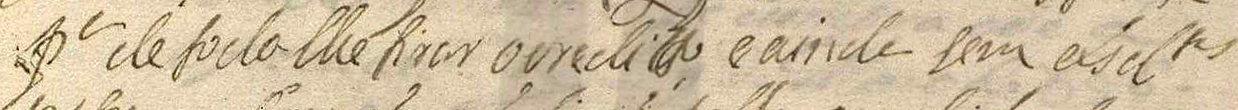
pa de todo lhe tirar o creditto, e ainda sem as dtas
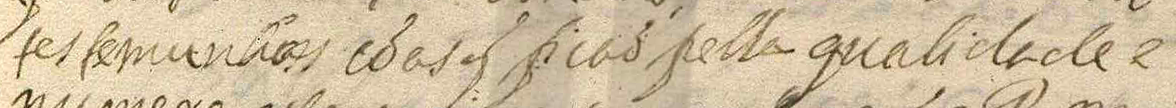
testemunhas cō as q̄ ficaõ pella qualidade e
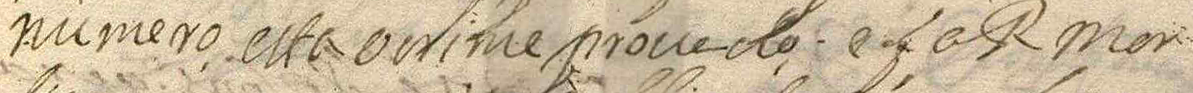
numero, esta o crime prouado; e q̄ a R mor
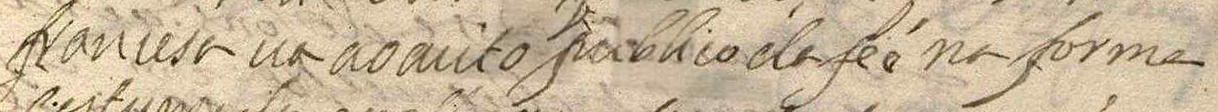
francesa ua ao auto publico da feé na forma
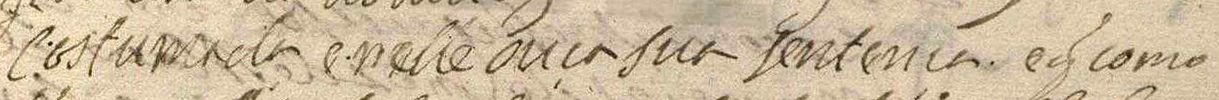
costumada e nelle ouça sua sentença. e q̄ como
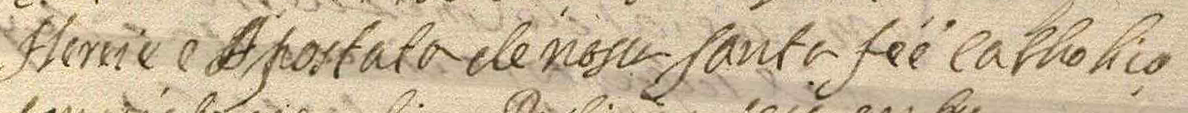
Hereie e Apostata de nossa santa feé catholico
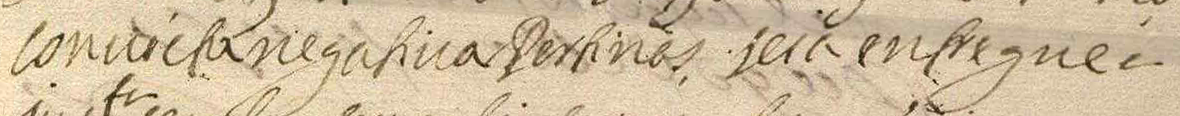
conuicta negatiua Pertinas, seia entregue a
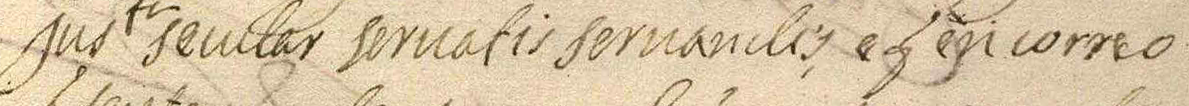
justa secular seruatis seruandis, e q̄ encorreo
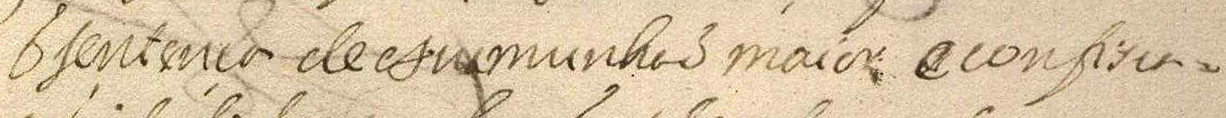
ē sentença de excomunhaõ maior e confisca
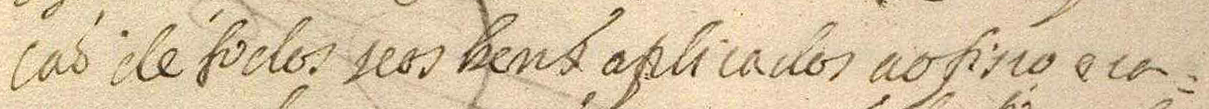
çaõ de todos seos bens aplicados ao fisco e ca
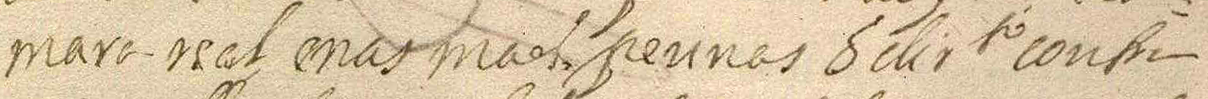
mara real, e nas maes pennas ē dirto contra
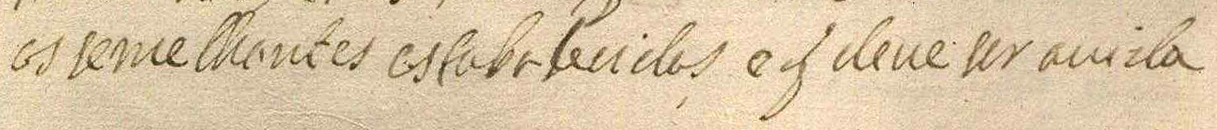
os semelhantes estabalecidas e q̄ deue ser auida
